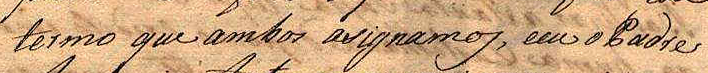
termo que ambos asignamos, e eu o Padre
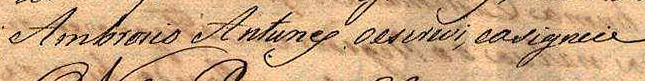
Ambrosio Antunes o escrevi, e asignei
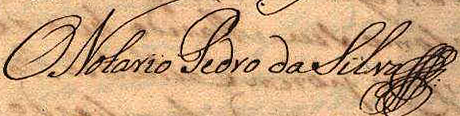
O Notario Pedro da Silva
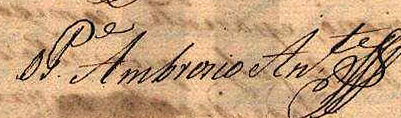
o Pe Ambrosio An.tes
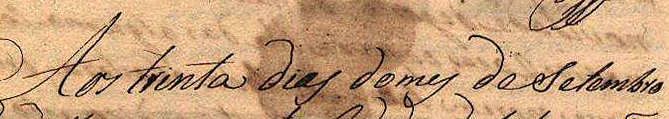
Aos trinta dias do mes de Setembro
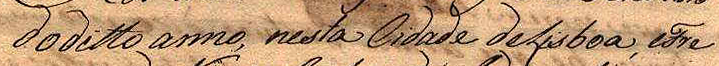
do ditto anno, nesta Cidade de Lisboa, e Fre
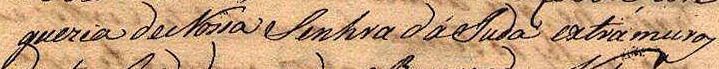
guezia de Nossa Senhora daIuda extramuros
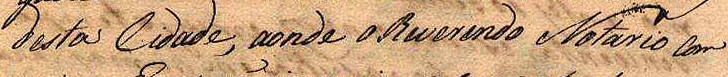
desta Cidade, aonde o Reverendo Notario com
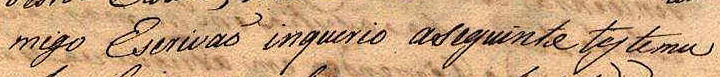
migo Escrivaõ inquerio a seguinte testemu
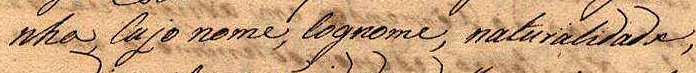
nha, cujo nome, cognome, naturalidade,
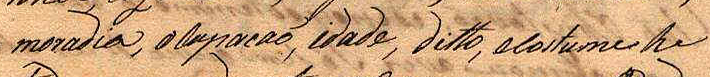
moradia, ocupaçaõ, idade, ditto, e costume he
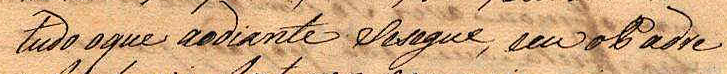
tudo o que ao diante se segue, e eu o Padre
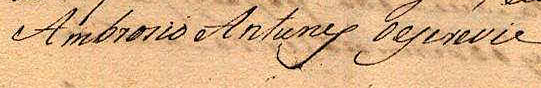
Ambrosio Antunes o escrevi
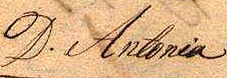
D. Antonia
